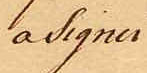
aSignei
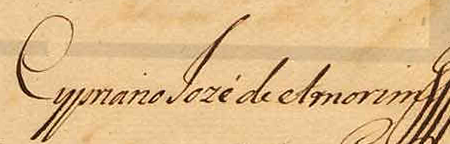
Cypriano Iozé de Amorim
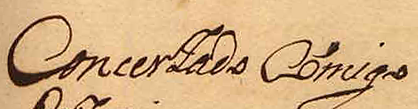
Concertado Cōmigo
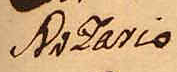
Notario
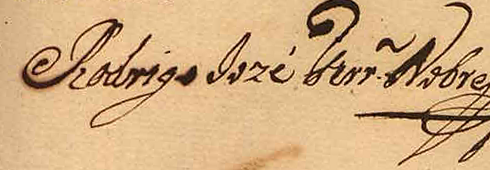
Rodrigo Iozé Ferr.a Nobre
